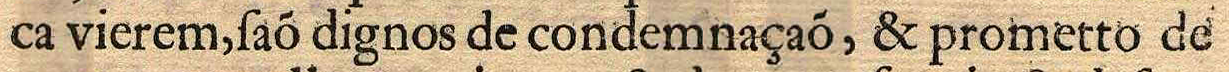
ca vierem, saõ dignos de condemnaçaõ, & prometto de
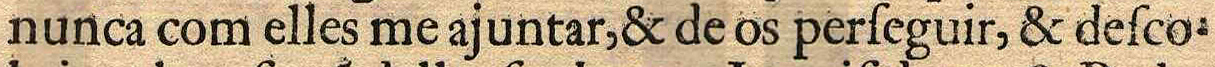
nunca com elles me ajuntar, & de os perseguir, & desco
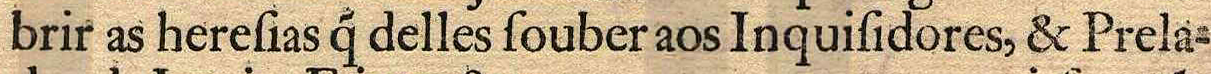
brir as heresias q̄ delles souber aos Inquisidores, & Prela
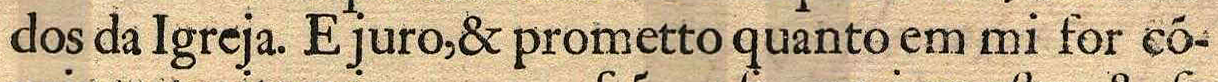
dos da Igreja. E juro, & prometto quanto em mi for cō
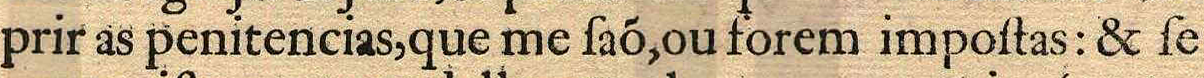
prir as penitencias, que me saõ, ou forem impostas: & se
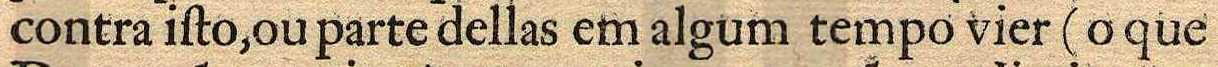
contra isto, ou parte dellas em algum tempo vier (o que
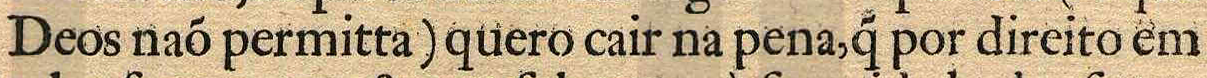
Deos naõ permitta) quero cair na pena, q̄ por direito em
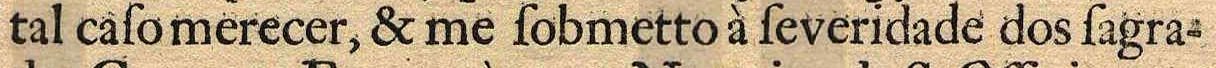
tal caso merecer, & me sobmetto à severidade dos sagra
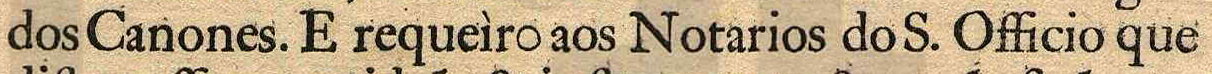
dos Canones. E requeìro aos Notarios do S. Officio que
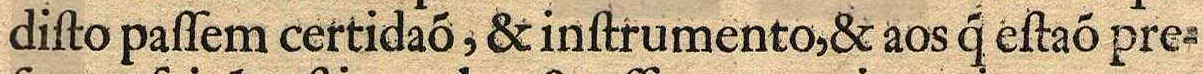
disto passem certidaõ, & instrumento, & aos q̄ estaõ pre
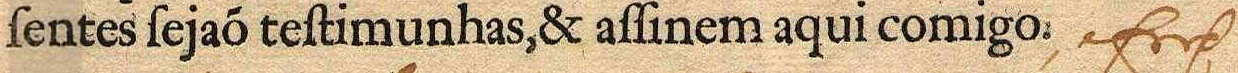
sentes sejaõ testimunhas, & assinem aqui comigo., e forão
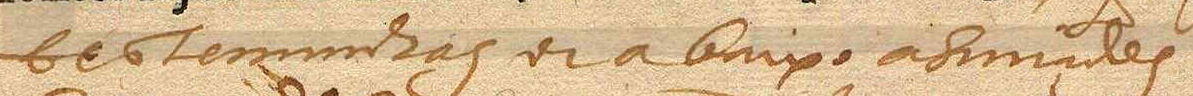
testemunhas os abaixo assinados
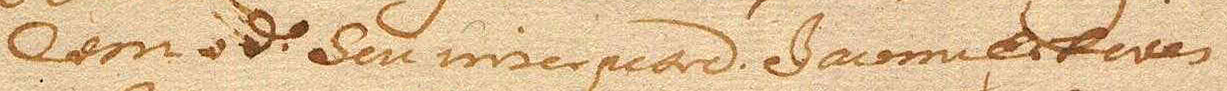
com o d.o Seu interpetre. Jacome Esteves
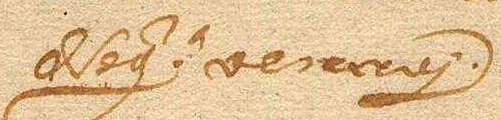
Nog.a o escrevj.
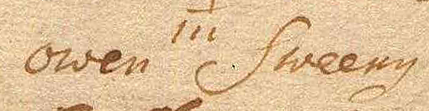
owen Sweeny
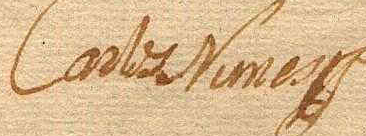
Carlos Nunes
